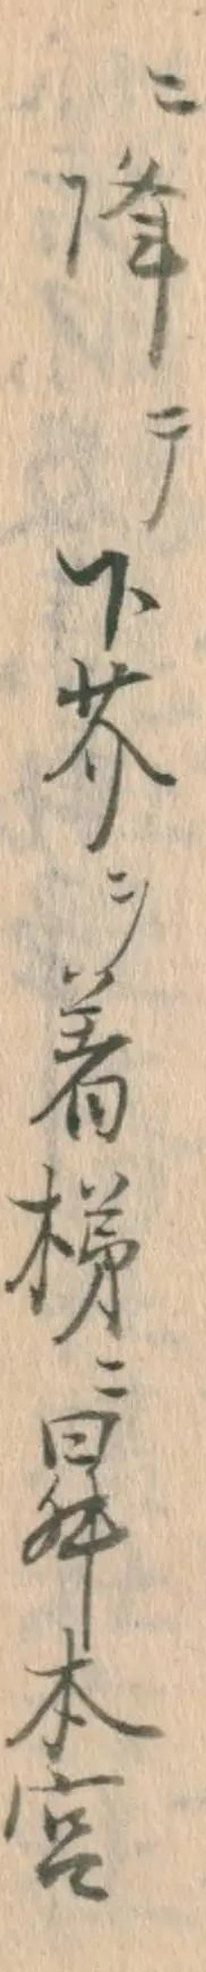ニ降テ下芥ヲ着梯ニ昇本宮
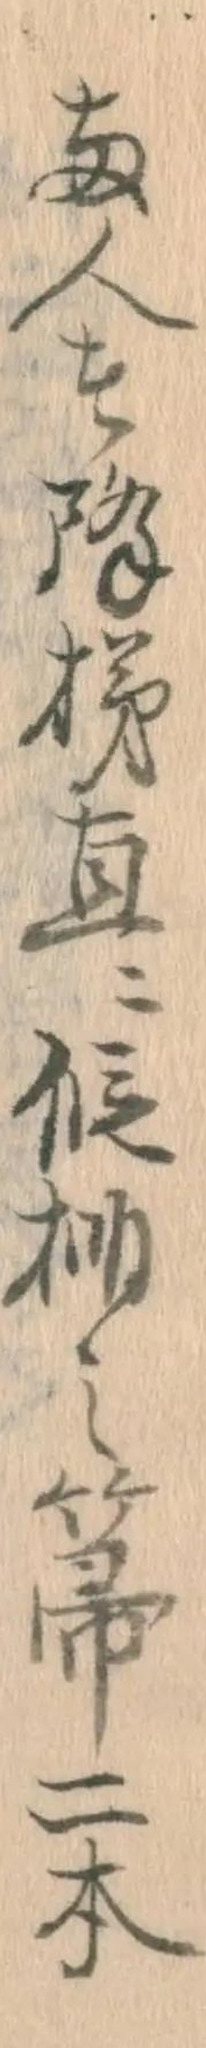両人は降梯直ニ仮棚之箒二本
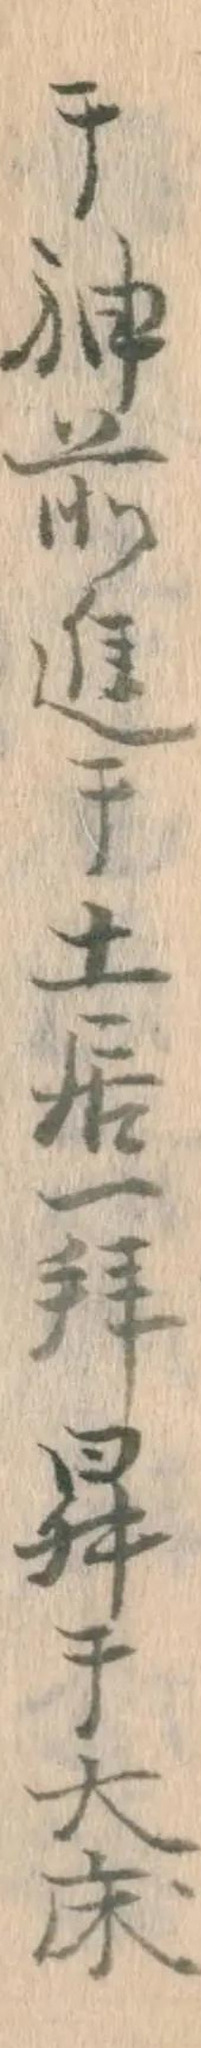于神前進于土居一拝昇于大床
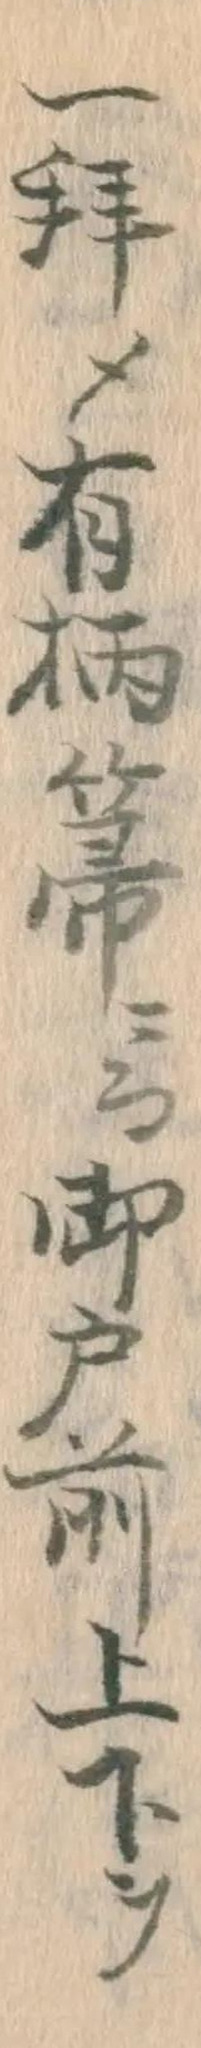一拝〆有柄箒ニ而御戸前上下ヲ
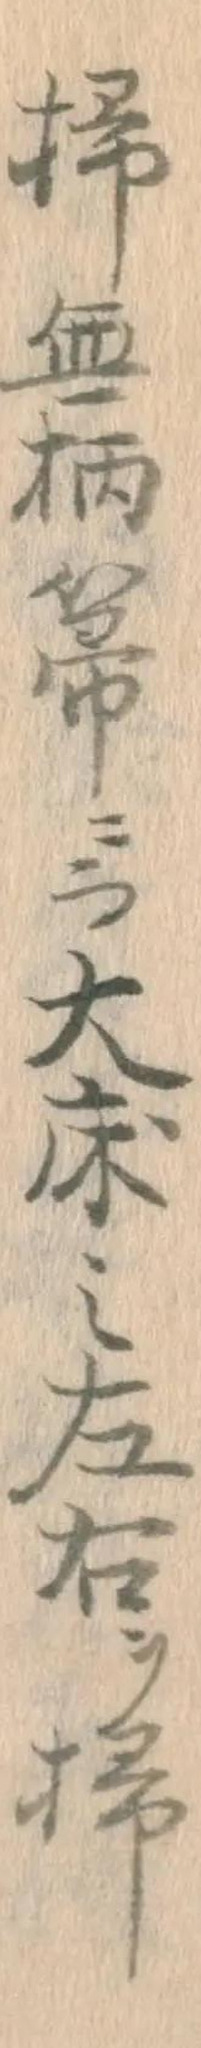掃無柄箒ニ而大床之左右ヲ掃
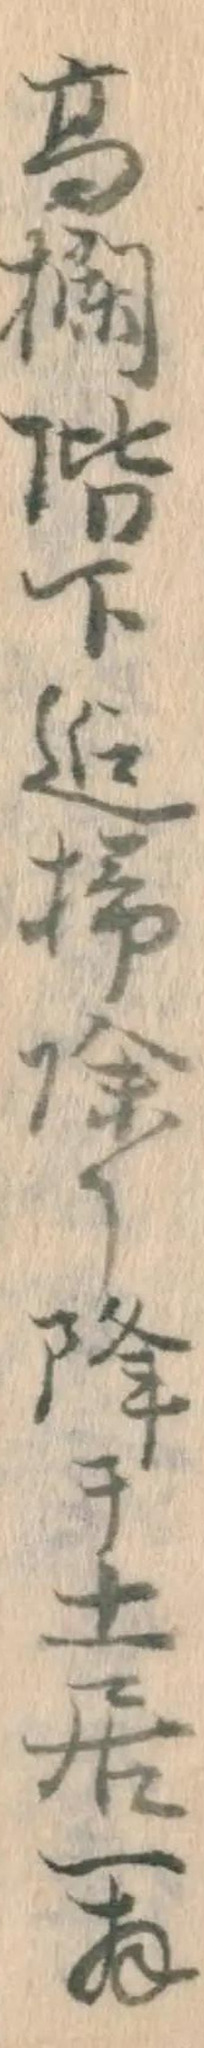高欄階下迄掃除終了降于土居一拝
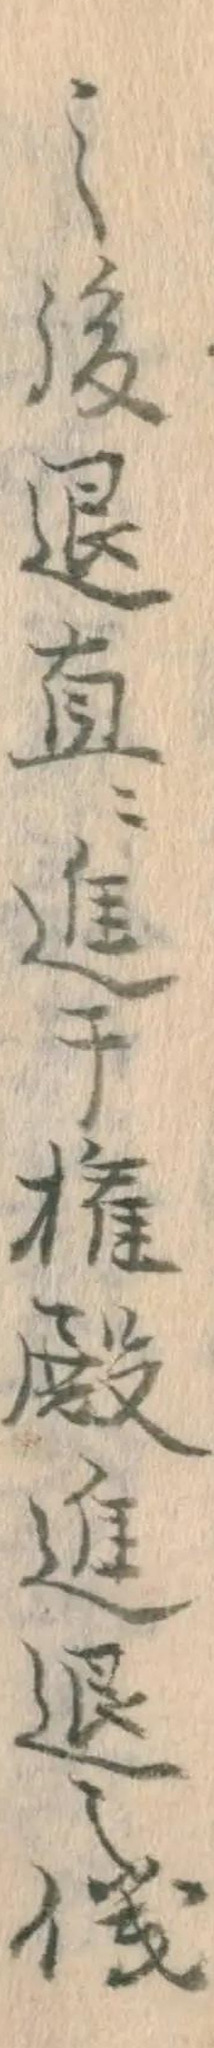之後退直ニ進于権殿進退之儀
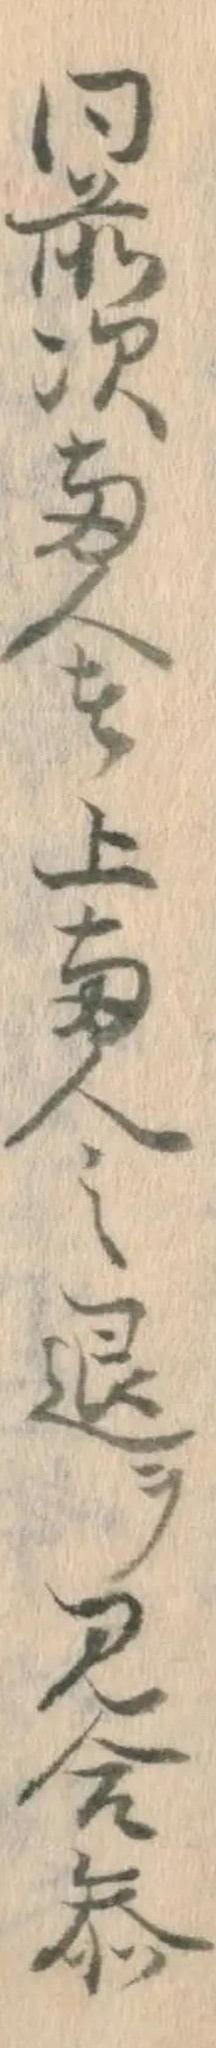同前次両人者上両人之退ヲ見合参
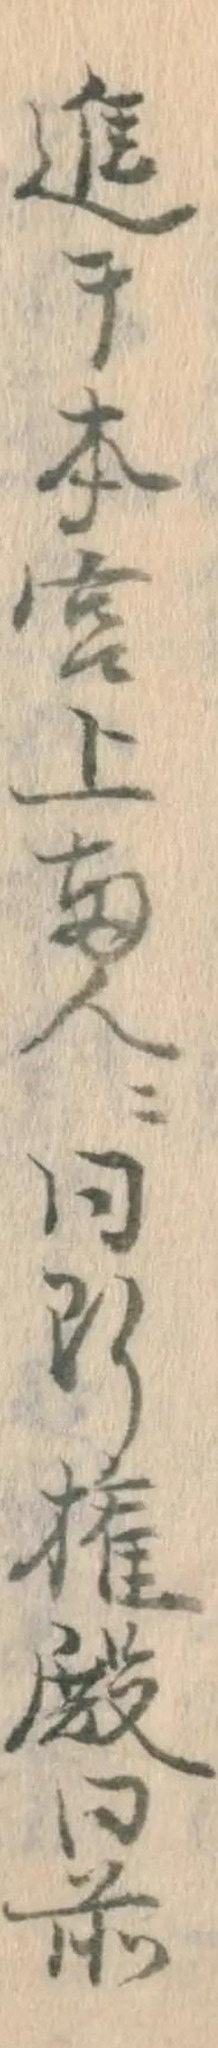進于本宮上両人ニ同断権殿同前
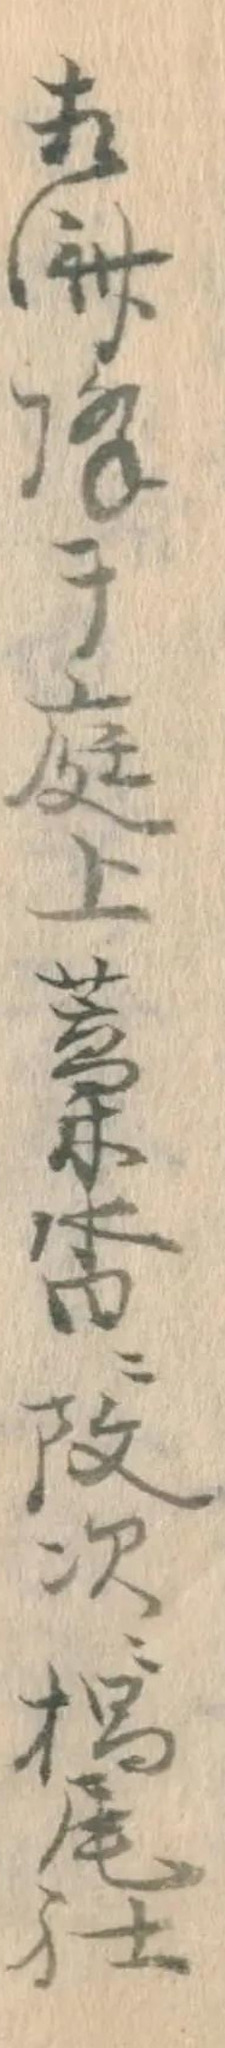相済降于庭上藁沓ニ改次ニ椙尾社
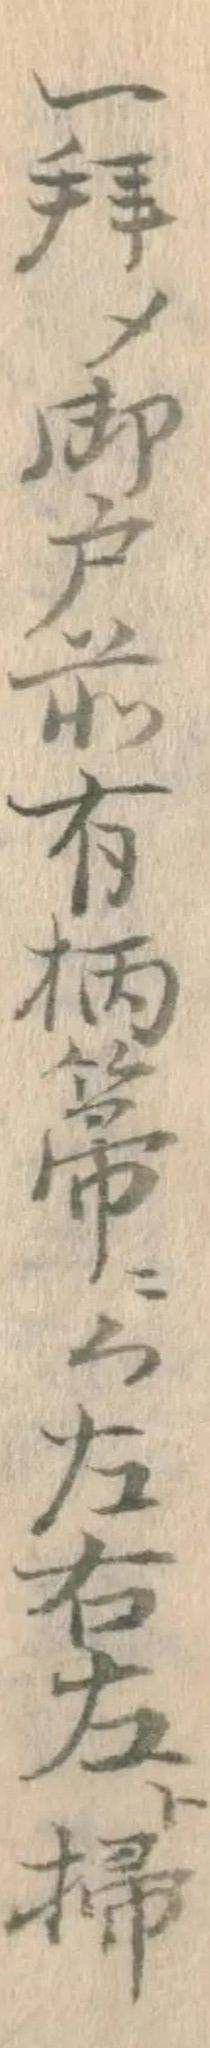一拝〆御戸前有柄箒ニ而左右左ト掃
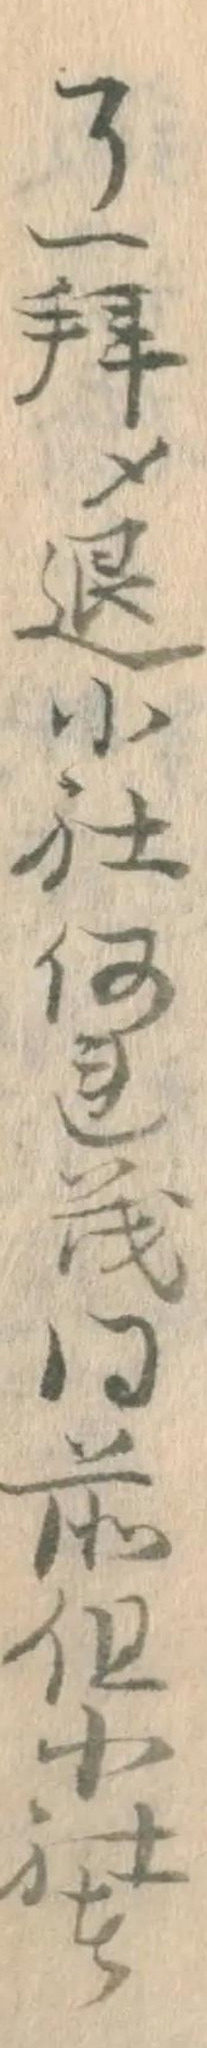了一拝〆退小社何れも同前但小社は

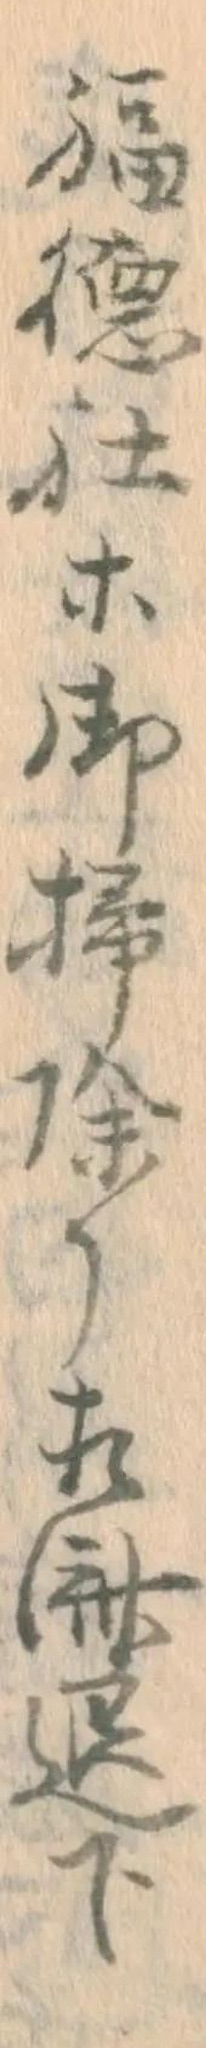福徳社等御掃除了相済退下
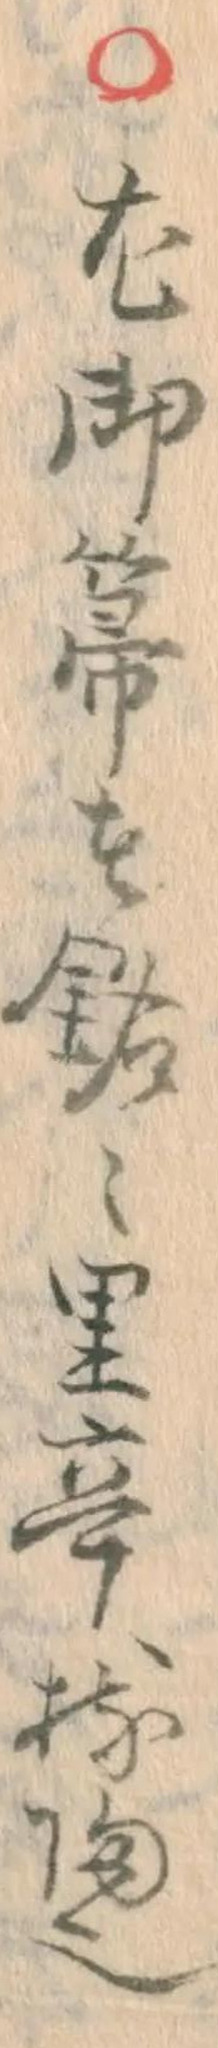◯尤御箒は銘〻里亨へ持帰也
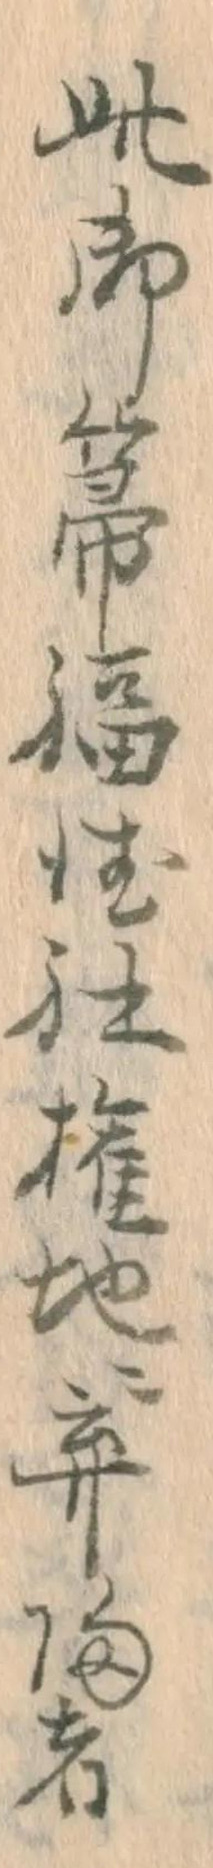此御箒福徳社権地ニ棄帰者
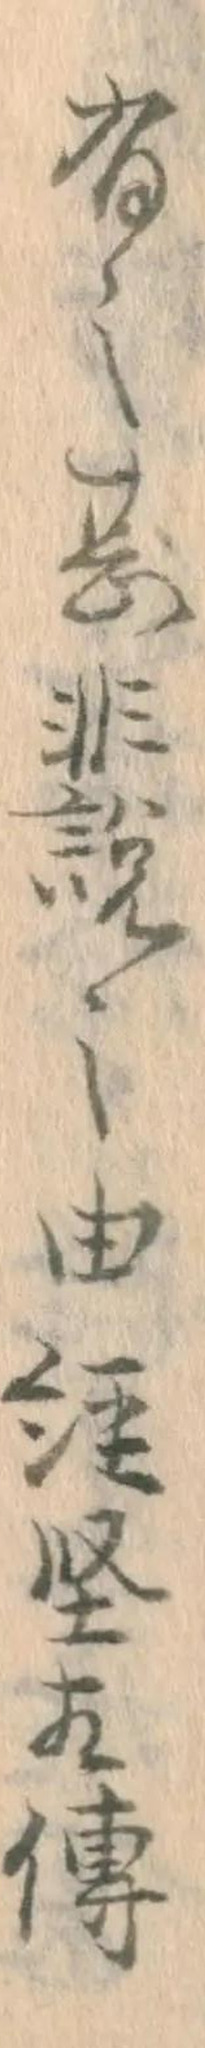有之甚非説之由経堅相傳
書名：賀茂社記録. 第81冊
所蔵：国立国会図書館 National Diet Library, JAPAN
